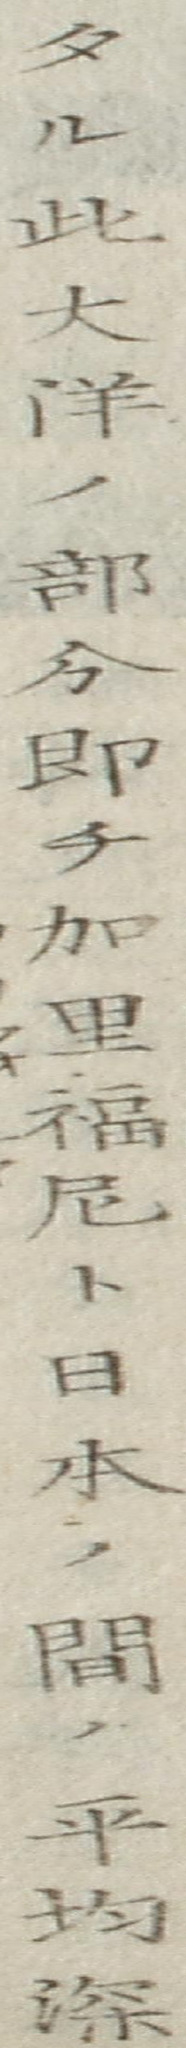タル此大洋ノ部分即チ加里福尼ト日本ノ間ノ平均深
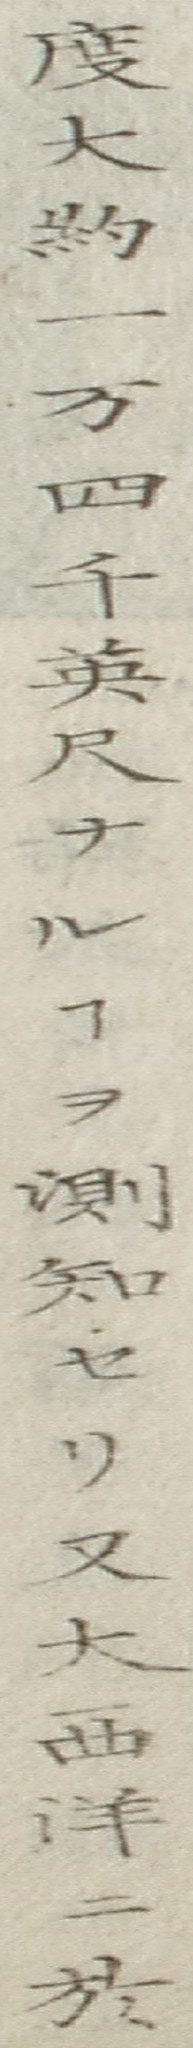度大約一万四千英尺ナルヿヲ測知セリ又大西洋ニ於
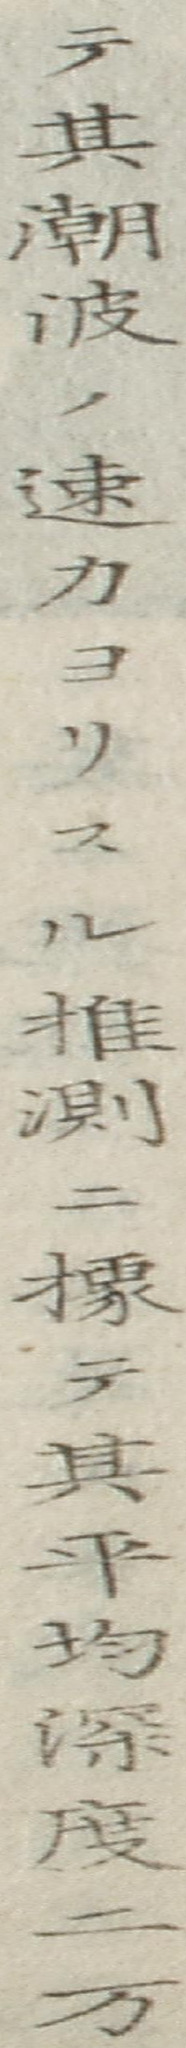テ其潮波ノ速力ヨリスル推測ニ據テ其平均深度二万
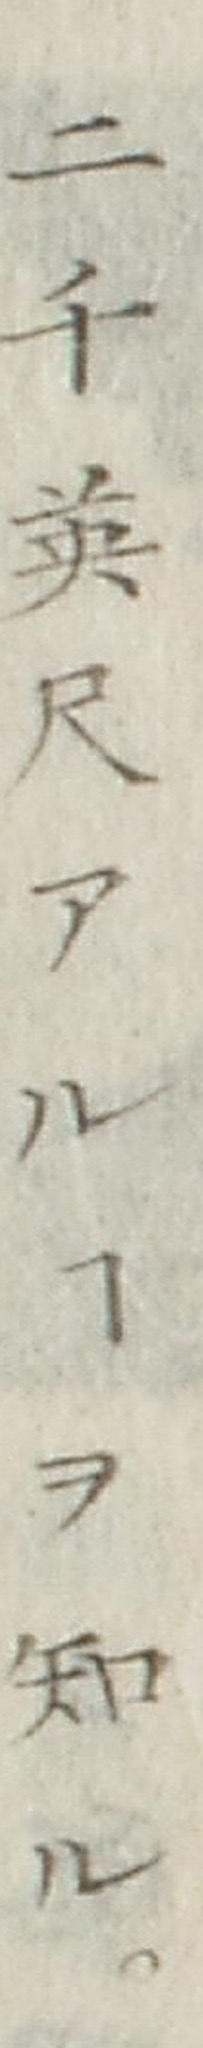二千英尺アルヿヲ知ル。
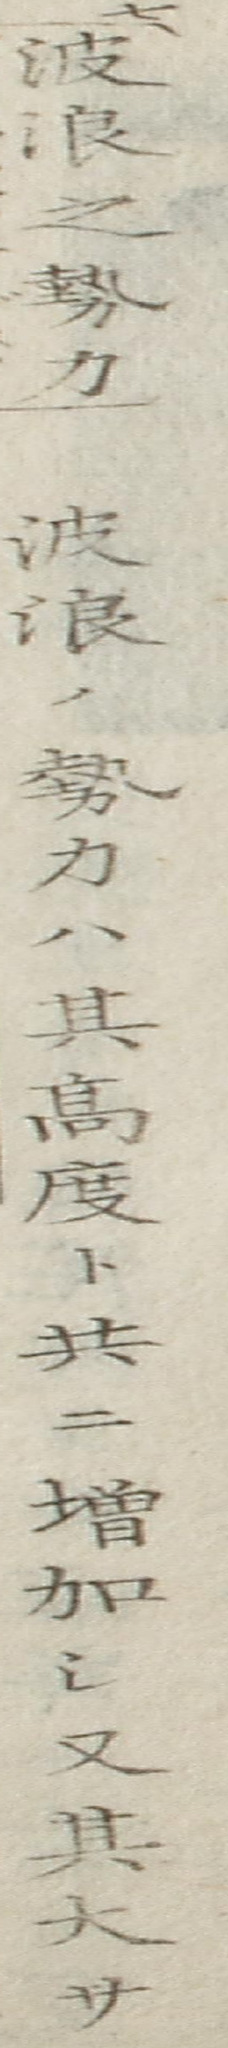十七〔波浪之勢力〕波浪ノ勢力ハ其高度ト共ニ増加シ又其大サ
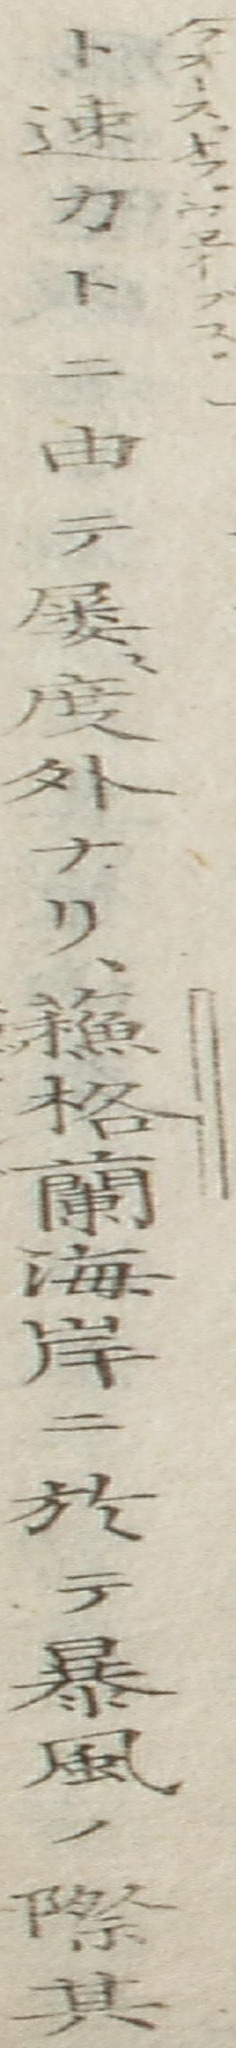ト速力トニ由テ屡々度外ナリ、蘓格蘭海岸ニ於テ暴風ノ際其
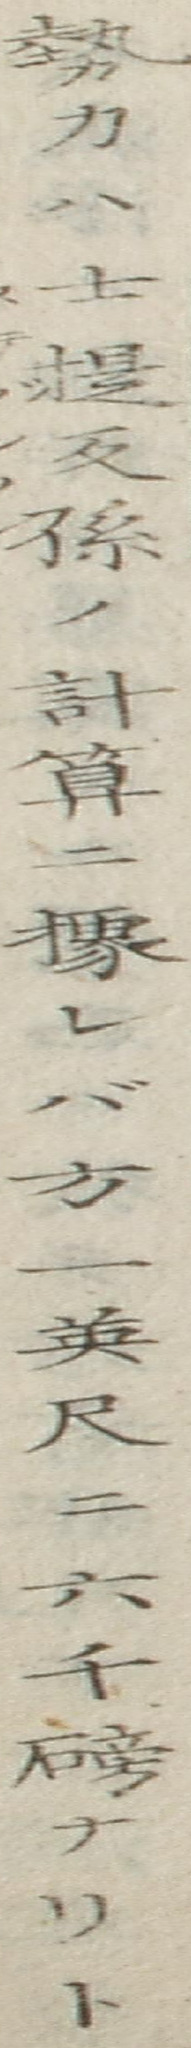勢力ハ士提反孫ノ計算ニ據レバ方一英尺ニ六千磅ナリト

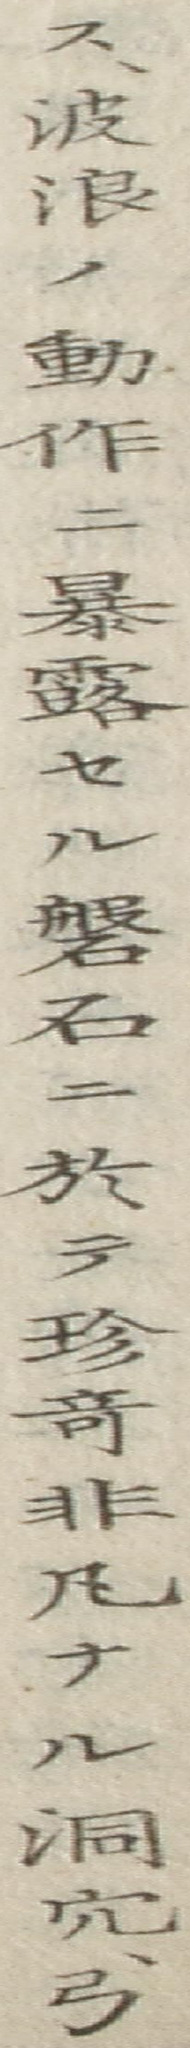ス、波浪ノ動作ニ暴露セル磐石ニ於テ珍奇非凡ナル洞穴、弓
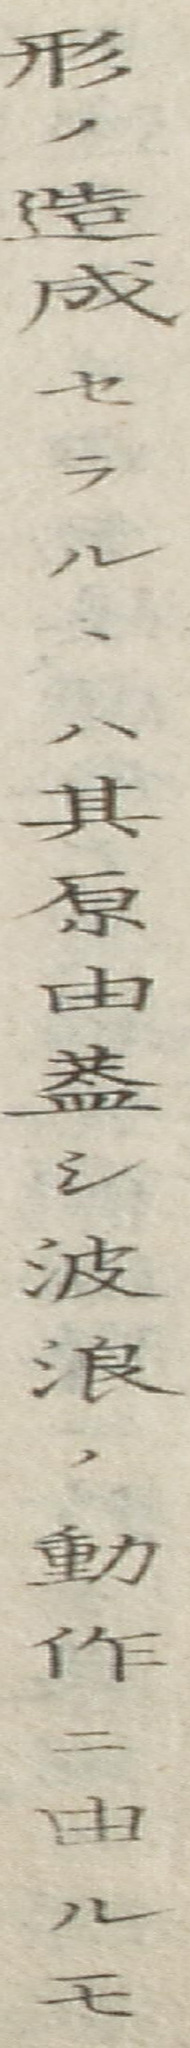形ノ造成セラルヽハ其原由蓋シ波浪ノ動作ニ由ルモ
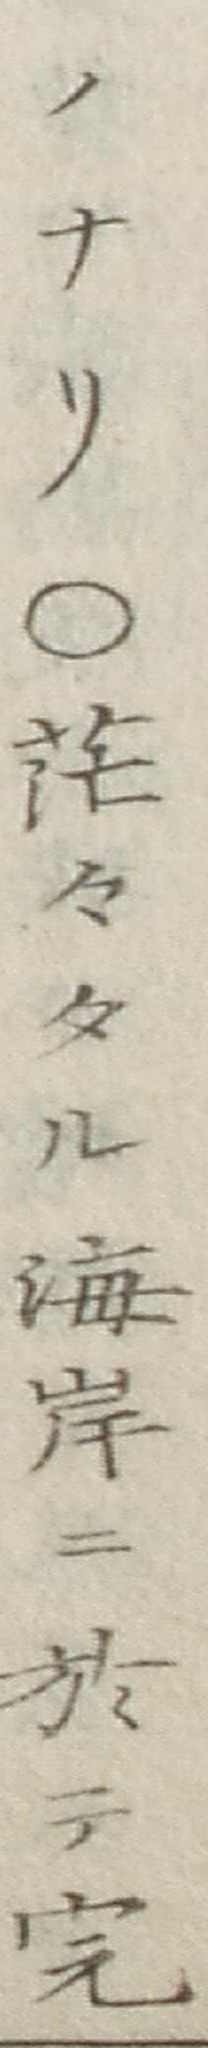ノナリ○茫々タル海岸ニ於テ完
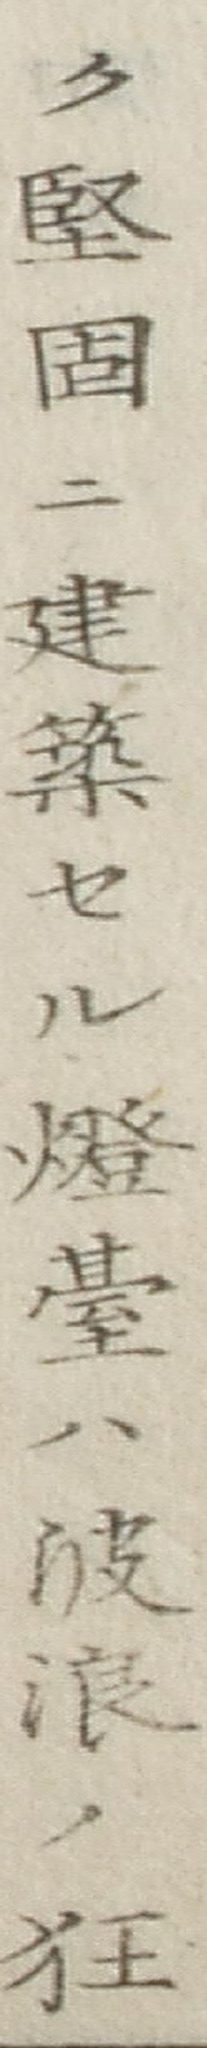ク堅固ニ建築セル燈台ハ波浪ノ狂
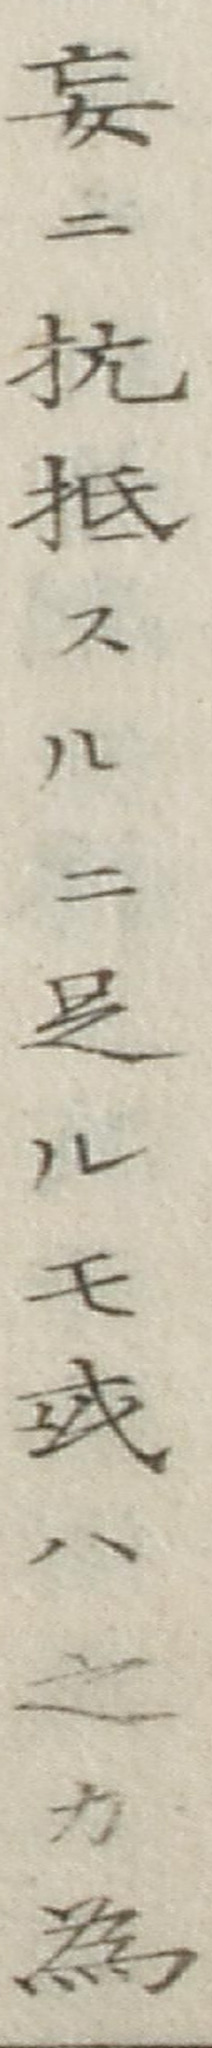妄ニ抗抵スルニ足ルモ或ハ之カ為
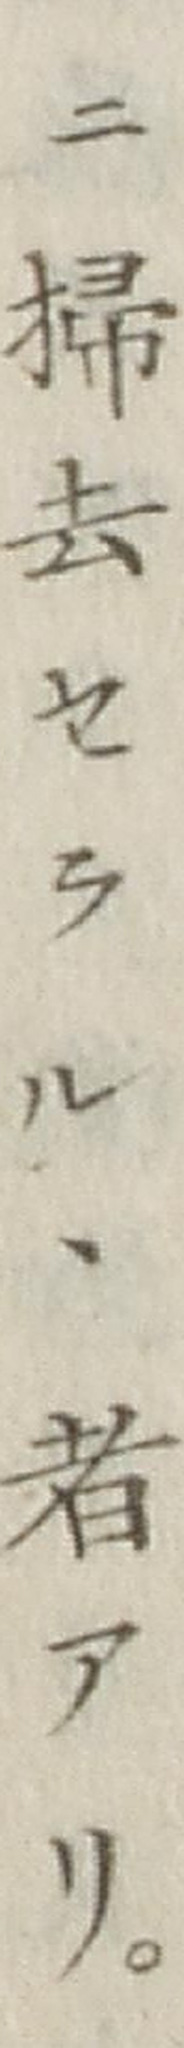ニ掃去セラルヽ者アリ。
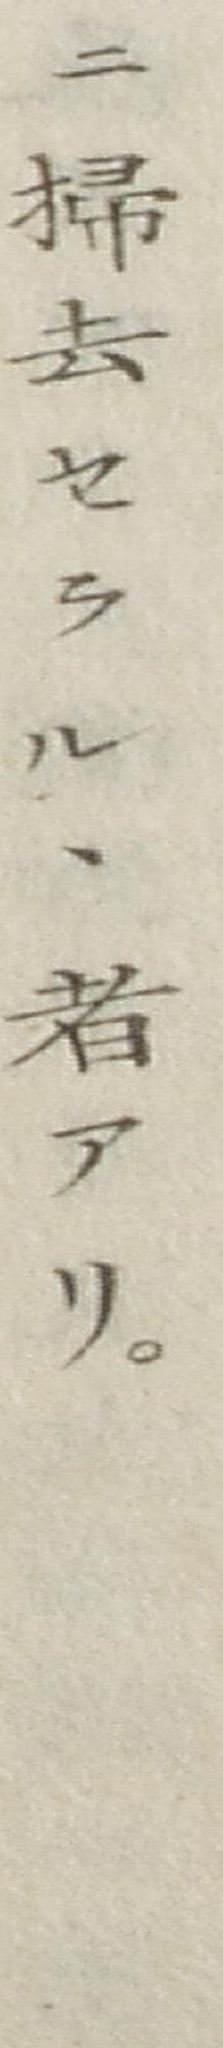ニ掃去セラルヽ者アリ。
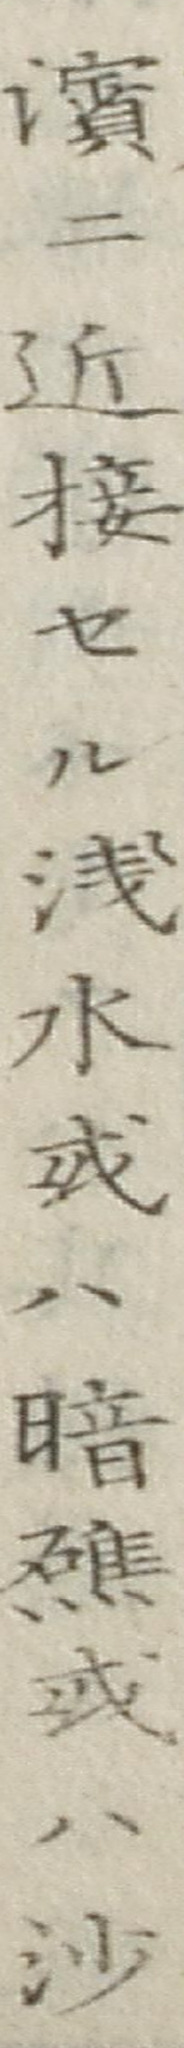浜ニ近接セル浅水或ハ暗礁或ハ沙
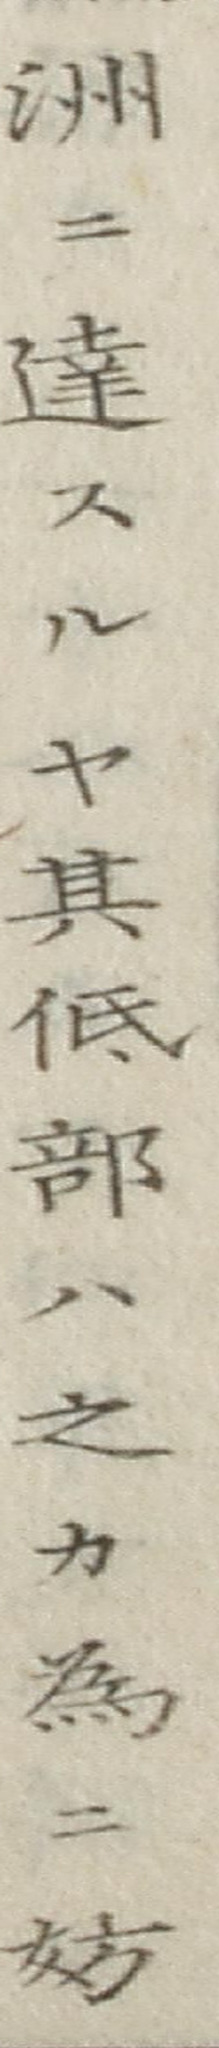洲ニ達スルヤ其低部ハ之カ為ニ妨
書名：地形論　巻二
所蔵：東京大学地震研究所図書室 Earthquake Research Institute Library, The University of Tokyo, JAPAN
